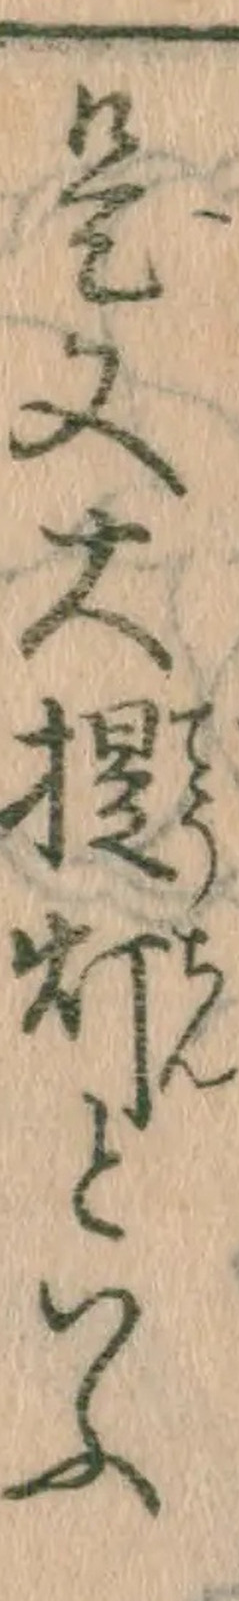是又大提灯といふ
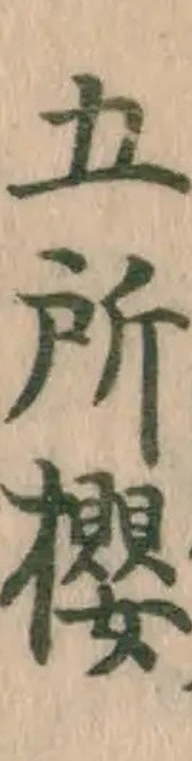五所桜

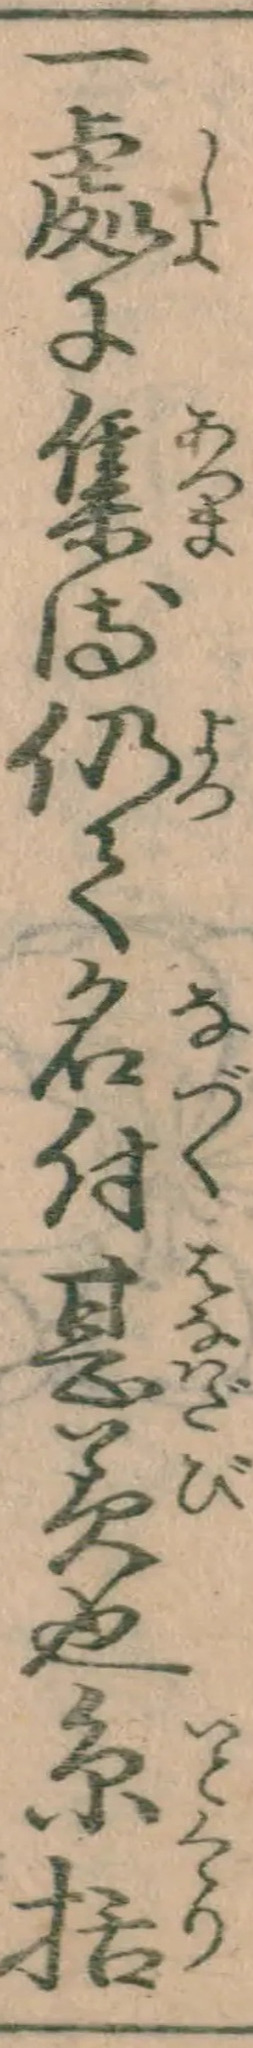一処に集る仍て名付甚美なり糸括
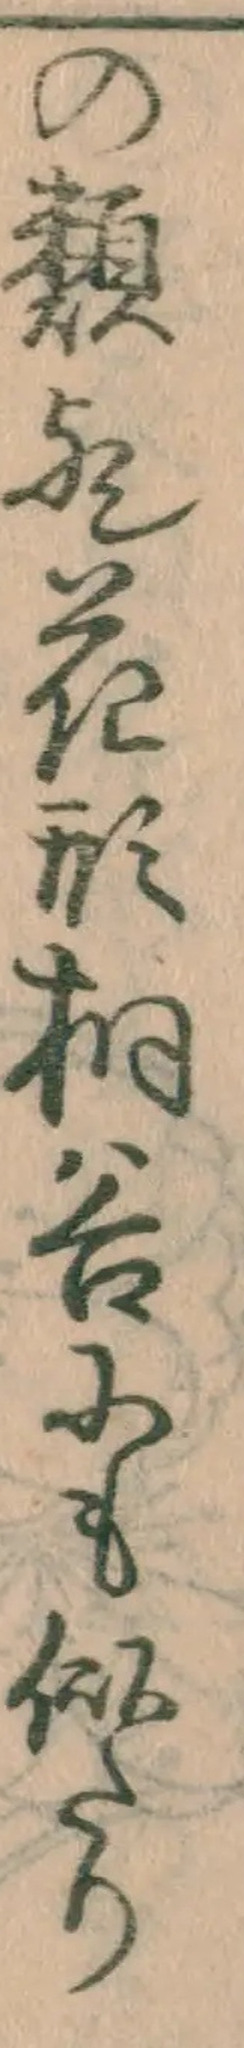の類歟花形桐谷にも似たり
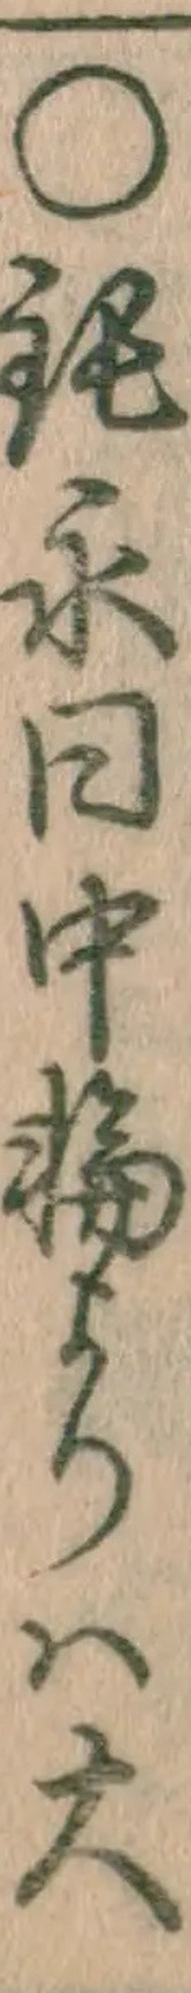○鈍永曰中輪よりは大
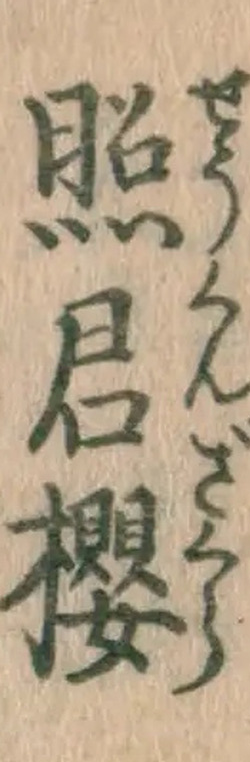照君桜
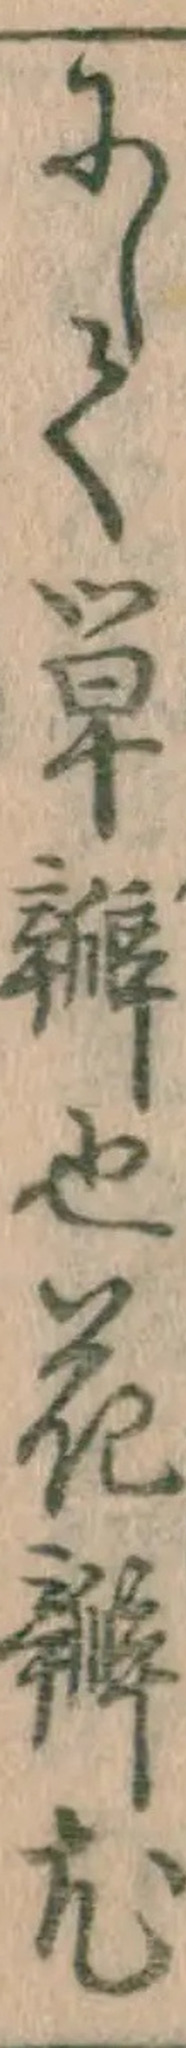にして単弁也花弁尤
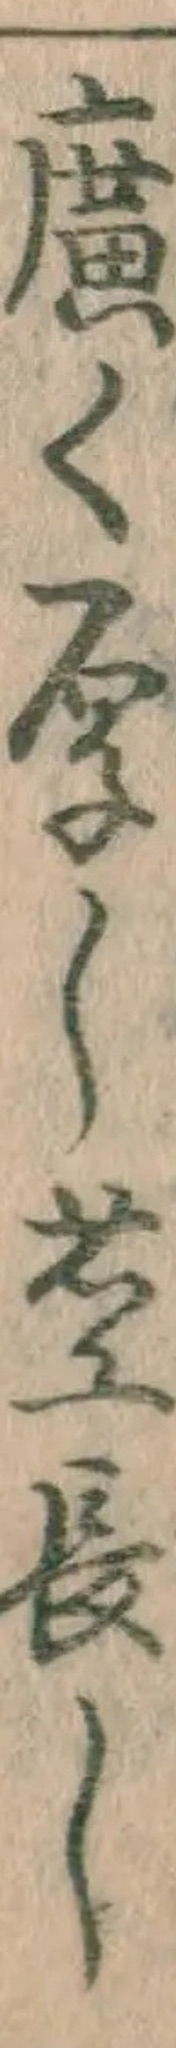広く厚し茎長し
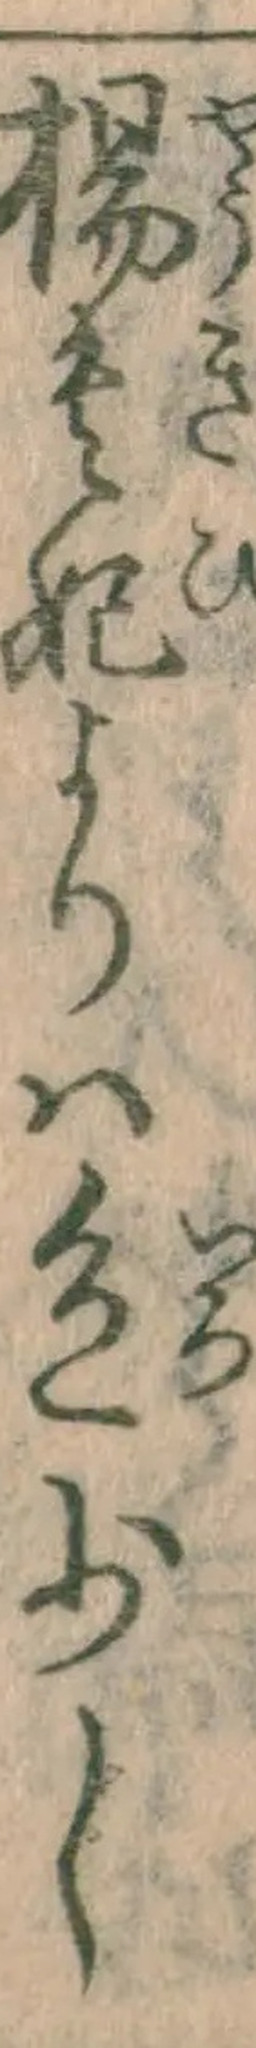楊貴妃よりは色少し
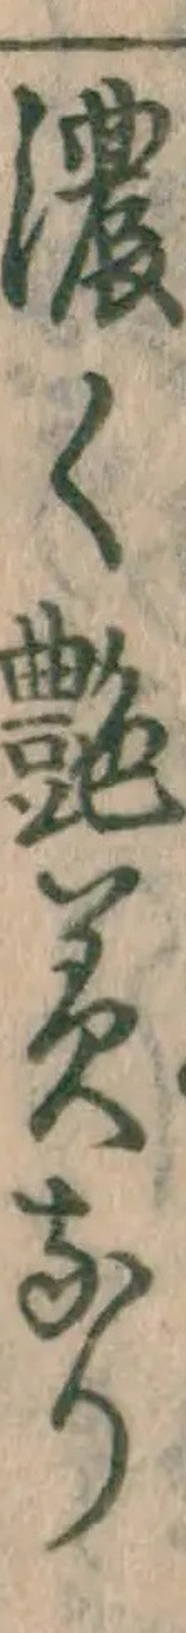濃く艶美なり
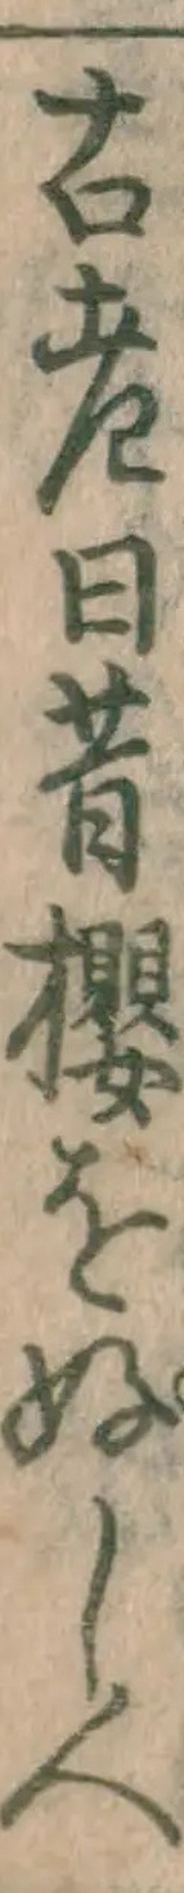古老曰昔桜を好し人
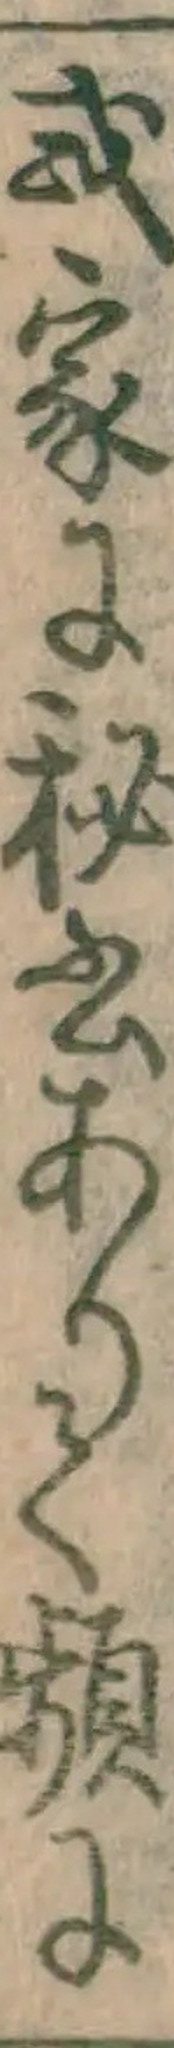或家に秘書ありて頻に

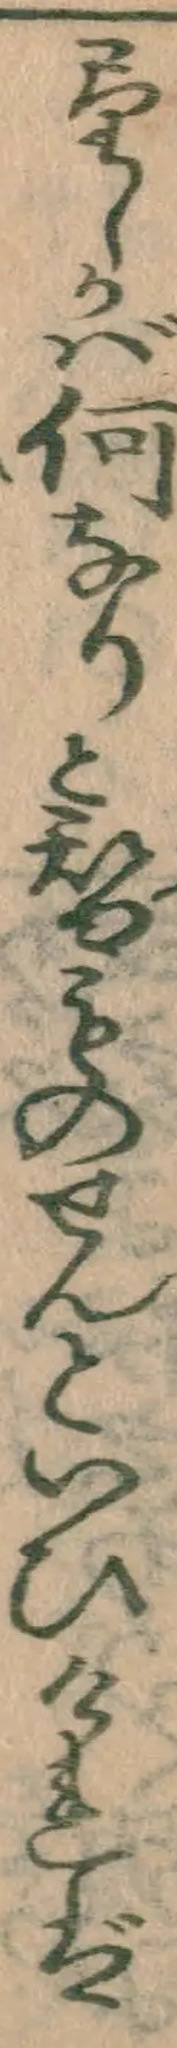望しかば何なりと替ものせんといひければ
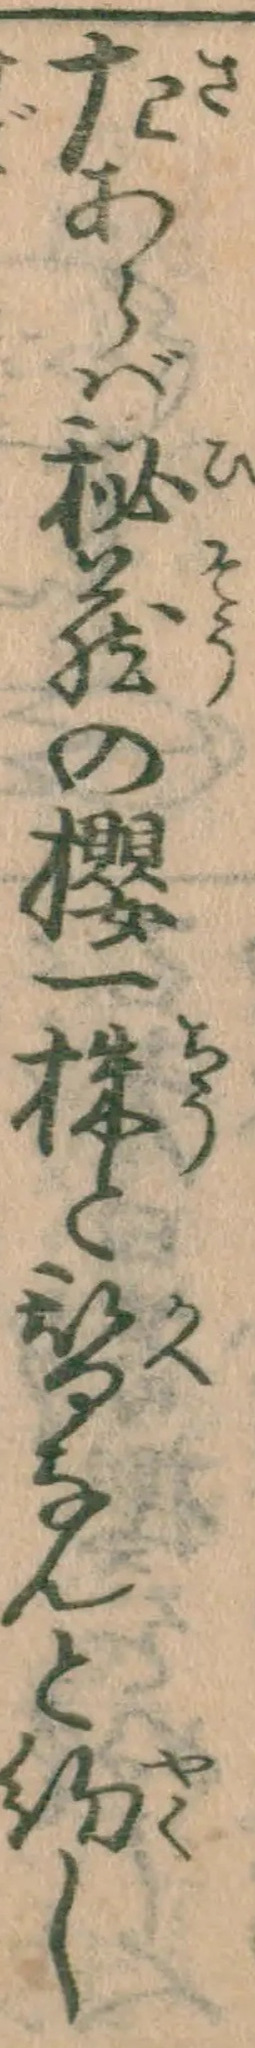左あらば秘蔵の桜一株と替なんと約し
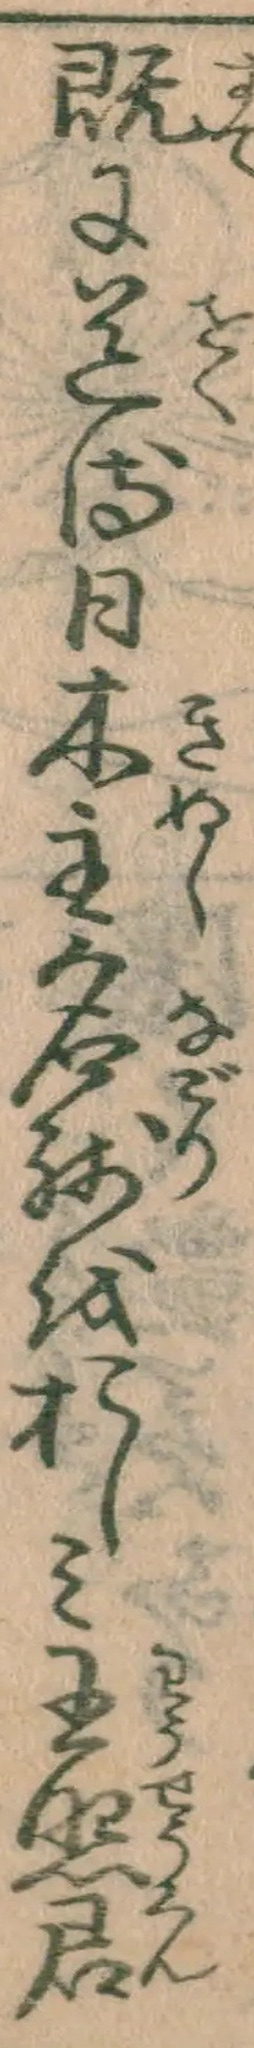既に送る日木主名残をおしみ王照君
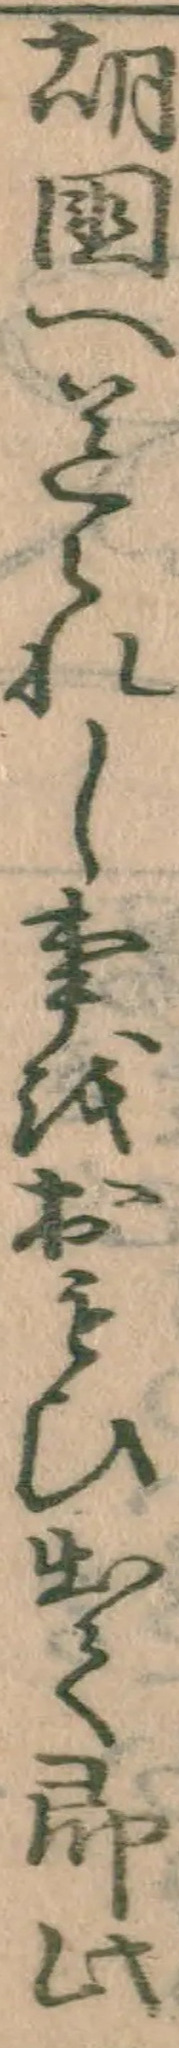胡国へ送られし事をおもひ出て即此
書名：怡顔齋櫻品
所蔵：国立国会図書館 National Diet Library, JAPAN
